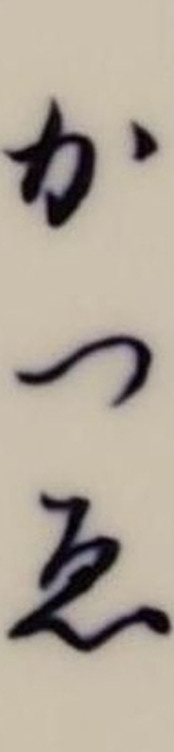かつえ
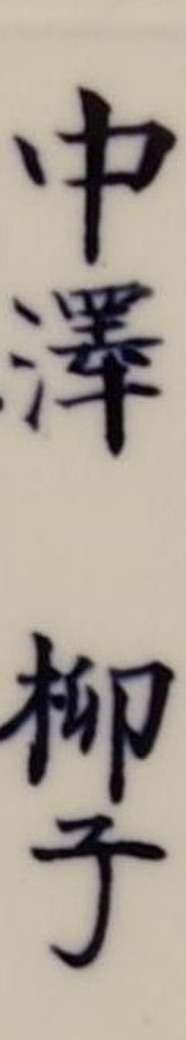中澤柳子
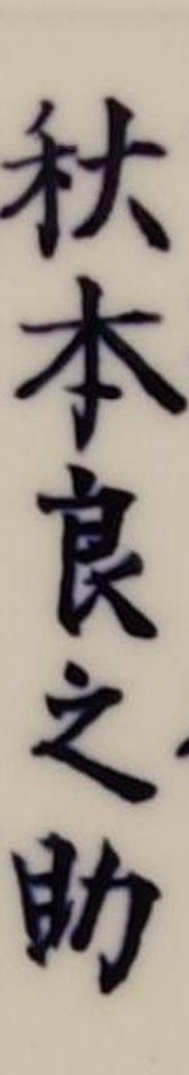秋本良之助
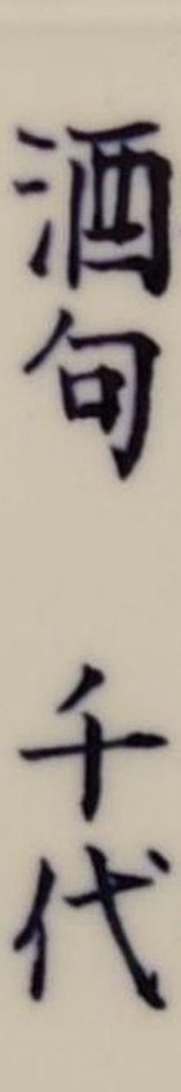酒句千代
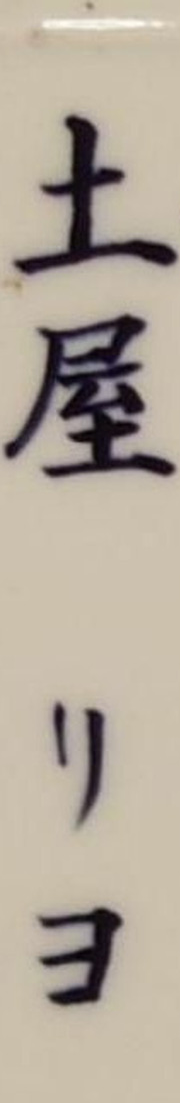土屋リヨ
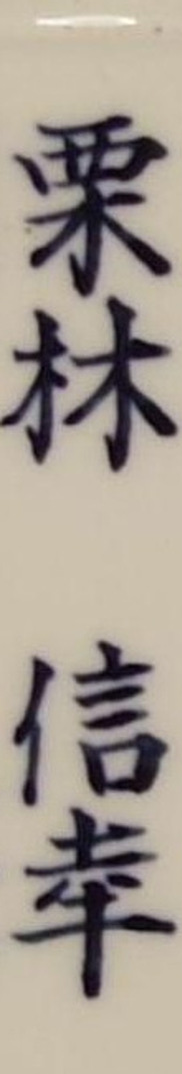栗林信幸
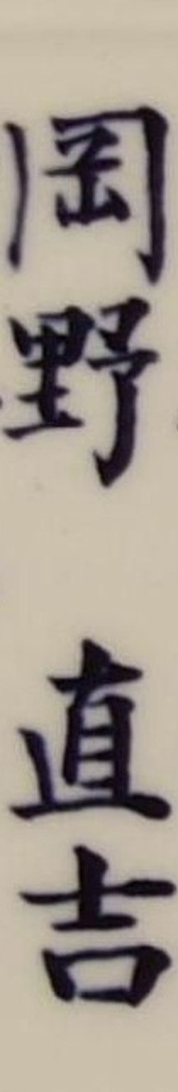岡野直吉
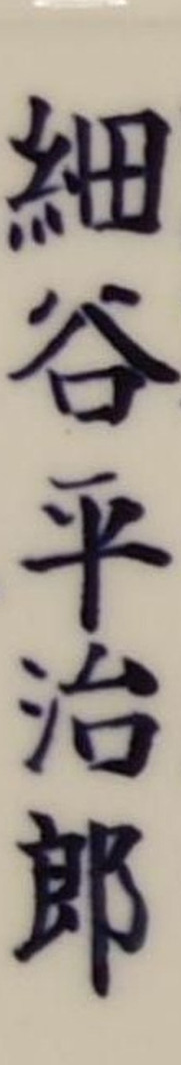細谷平治郎
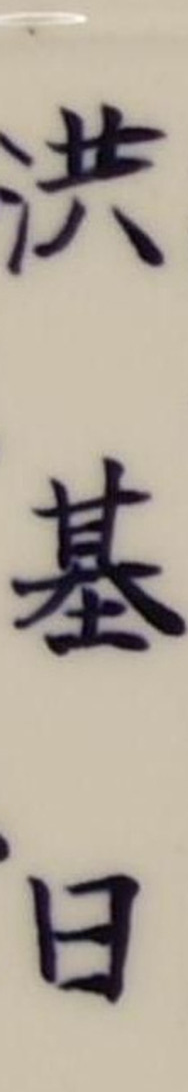洪基曰
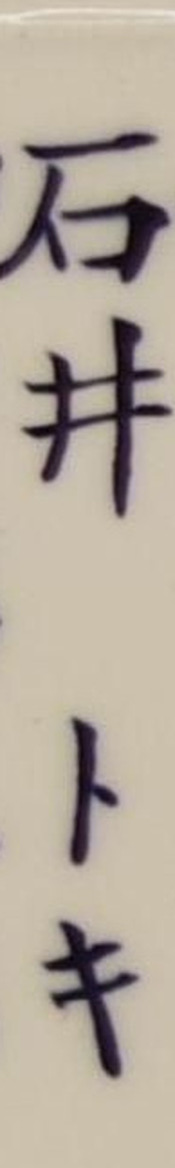石井トキ
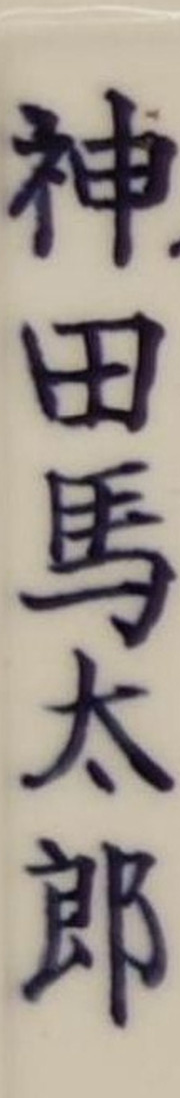神田馬太郎

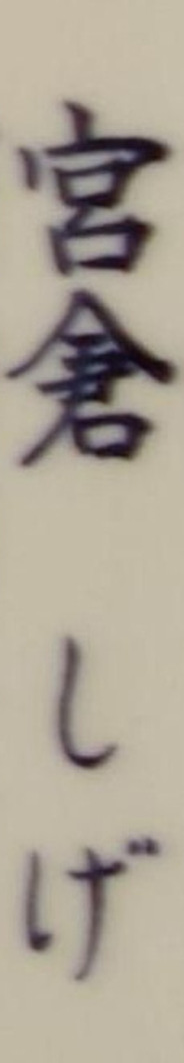宮倉しげ
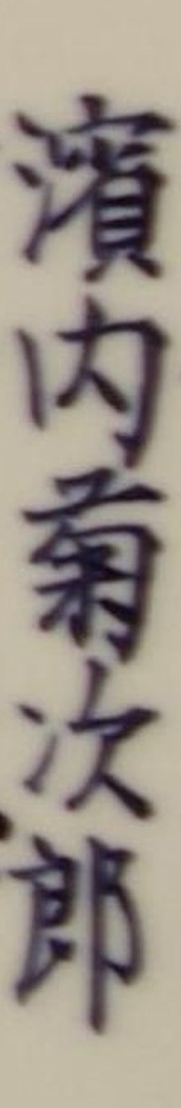濱内菊次郎
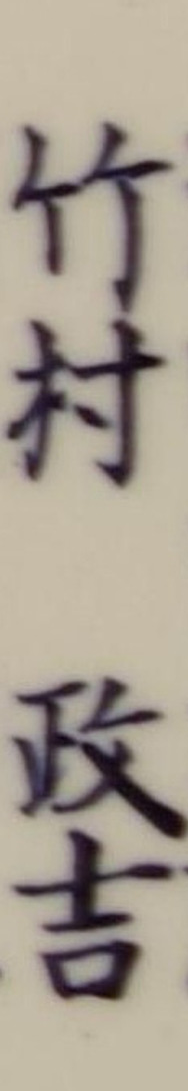竹村政吉
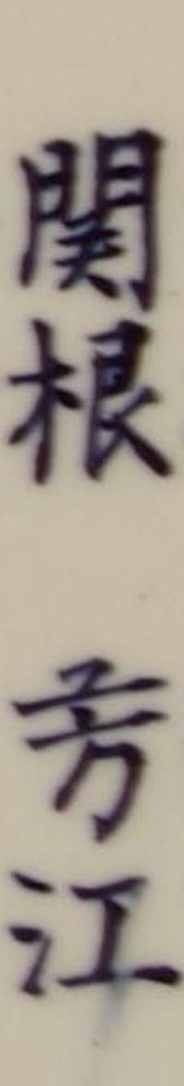関根芳江
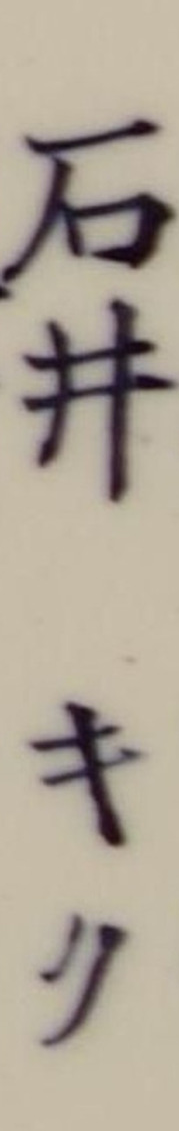石井キク
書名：E~L
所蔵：高野山金剛峯寺
